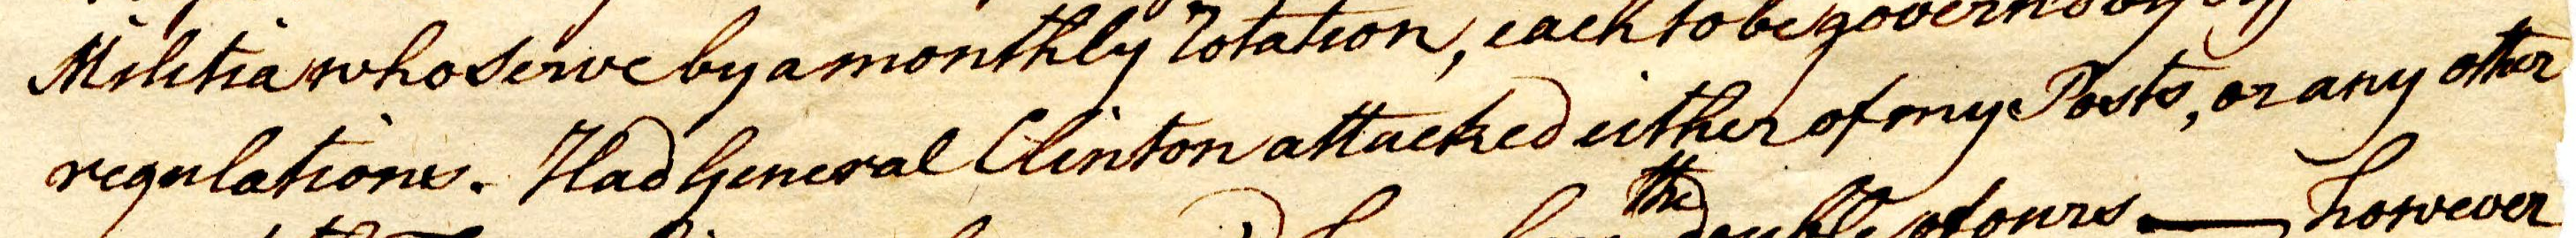regulations. Had General Clinton attacked either of my Posts, or any other
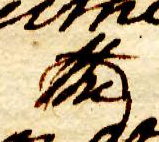the
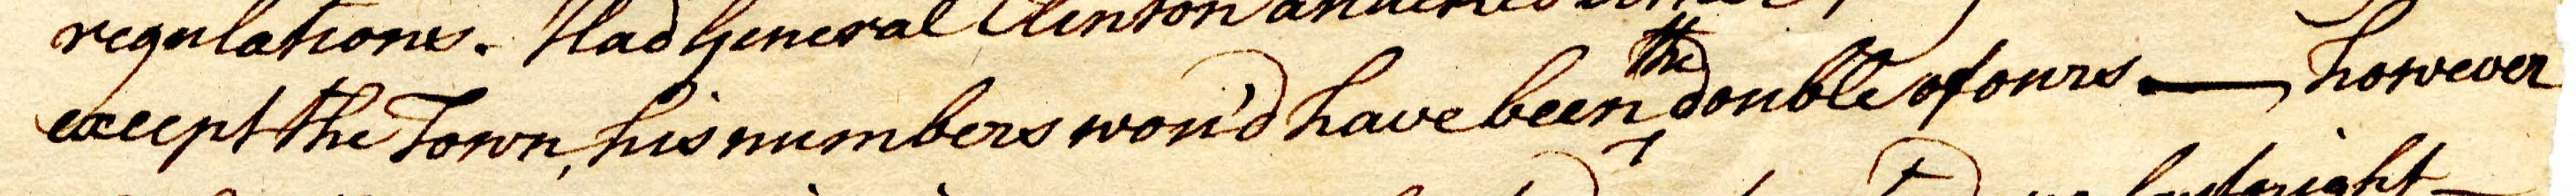except the Town, his numbers wou'd have been ^ double of ours- however
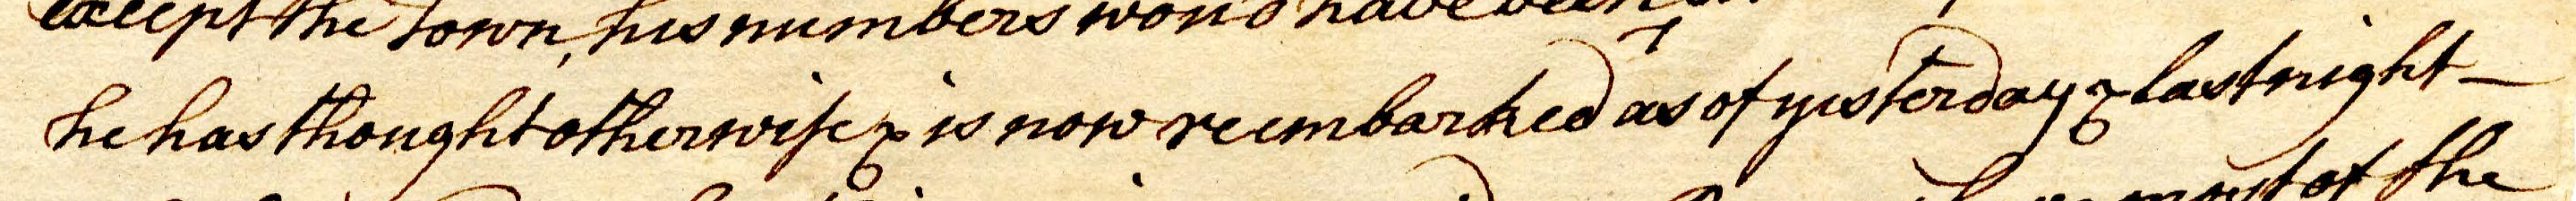he has thought otherwise, is now recmbarked as of yesterday & last night-
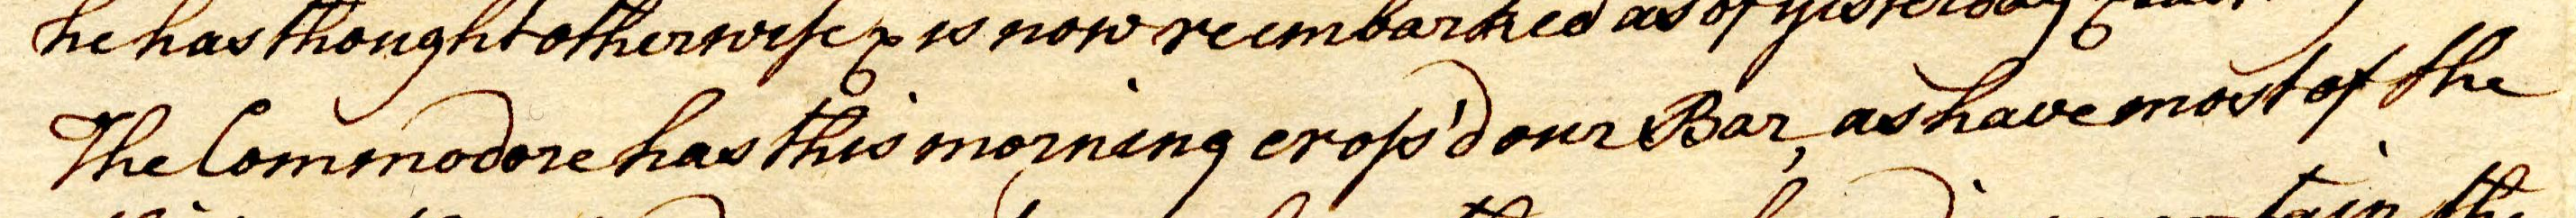The Commodore has this morning cross'd our Bar, as have most of the
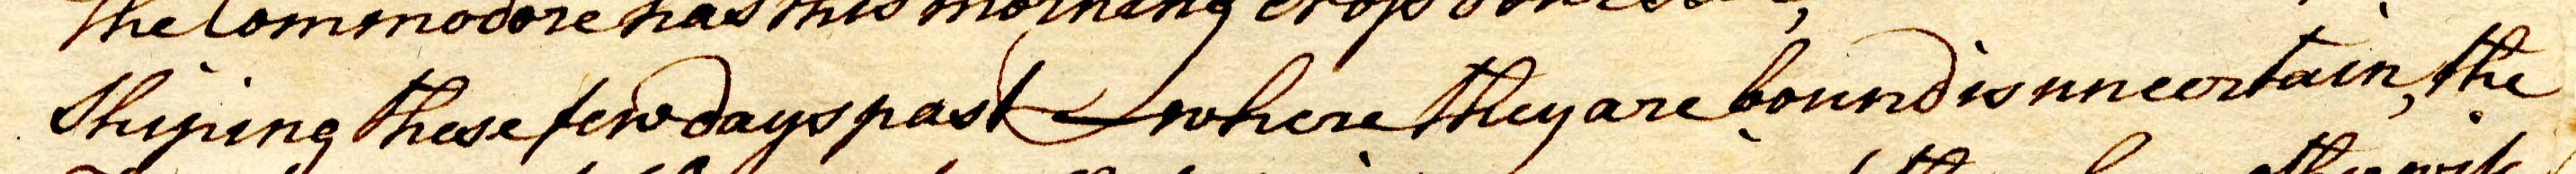Shiping these few days past where they are bound is uncertain, the
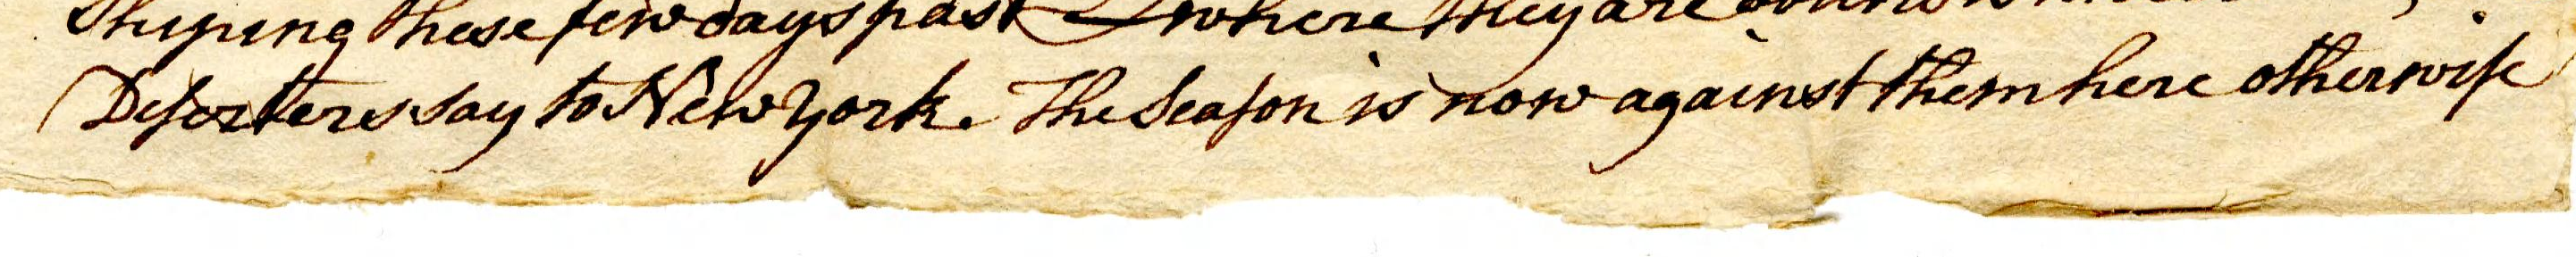Deserters say to New York. The season is now against them here otherwise
